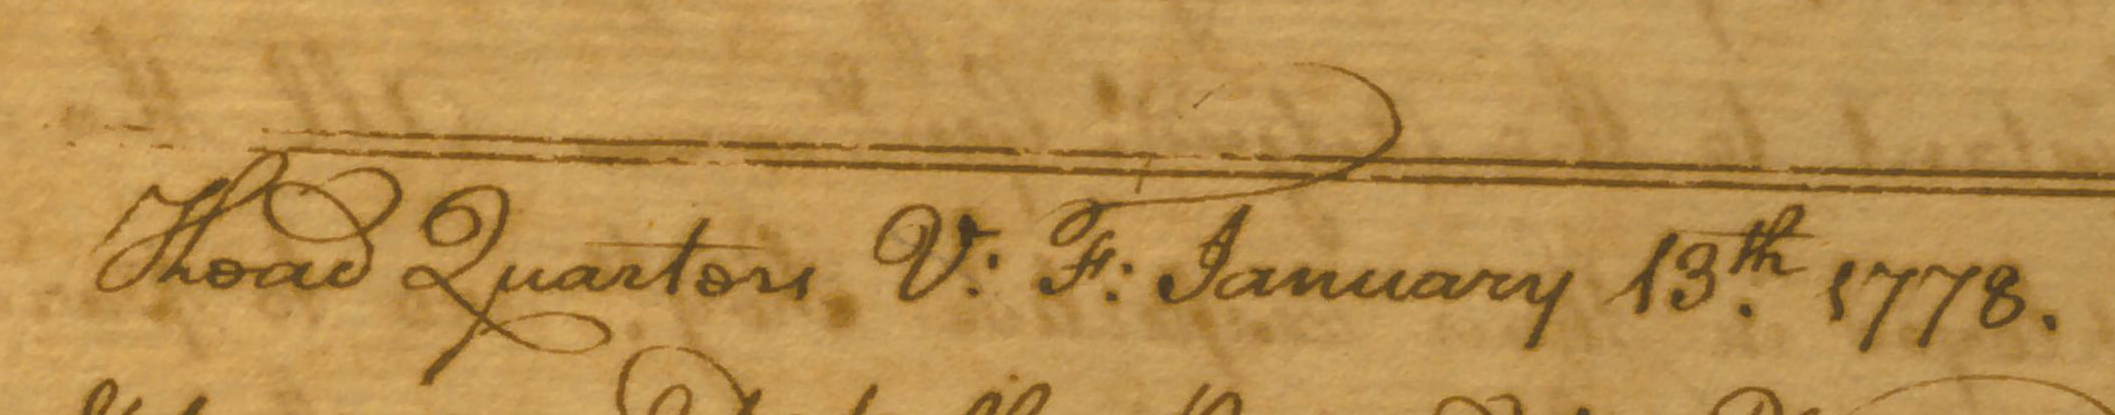Head Quarters V: F: January 13^th. 1778.
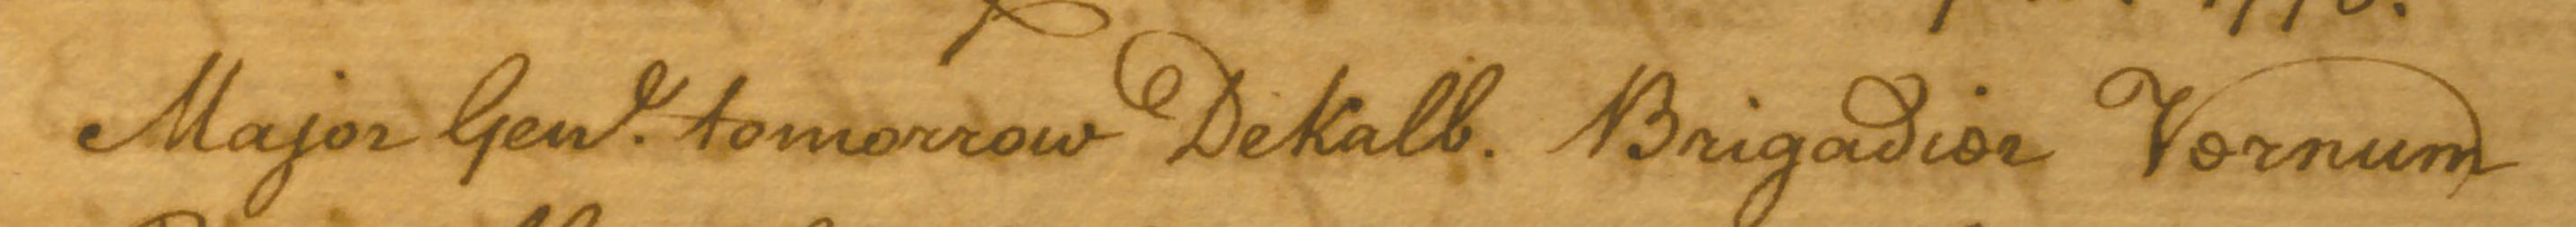Major Gen^l. tomorrow DeKalb. Brigadier Vernum
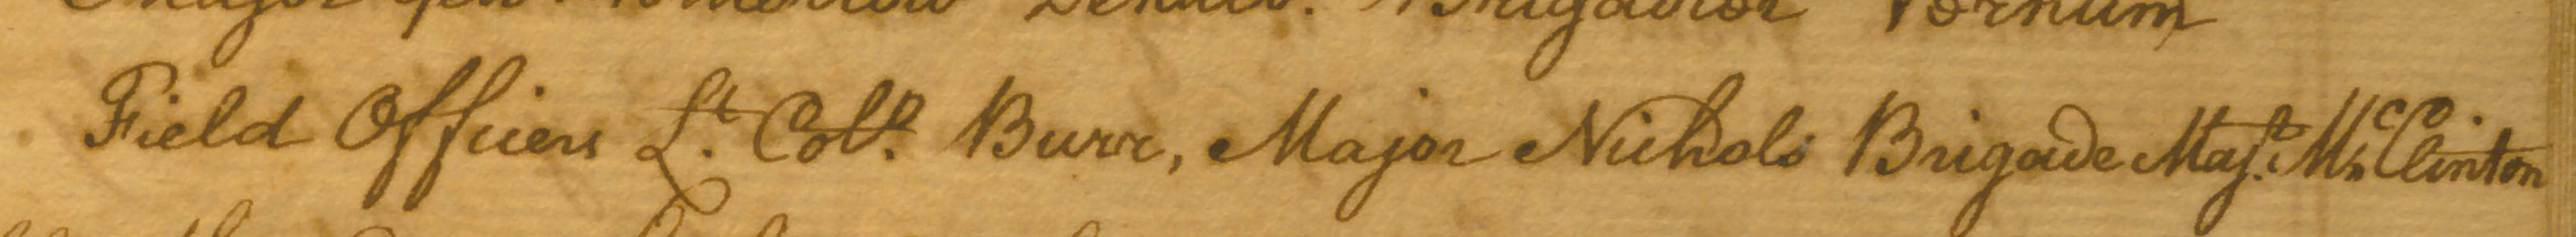Field Officers L^t. Col^o. Burr, Major Nichols Brigade Maj^r. M^c.Clinton
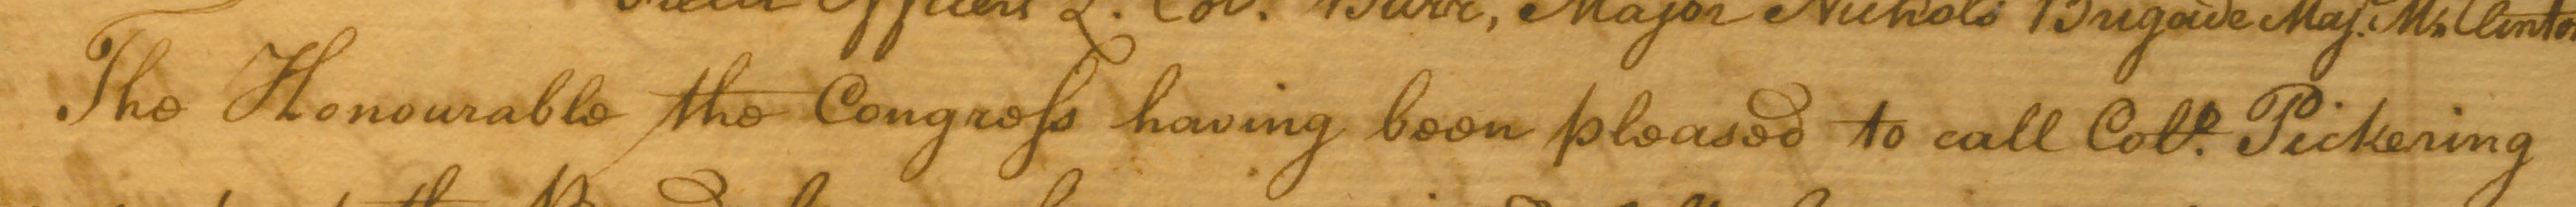The Honourable the Congress having been pleased to call Col^o. Pickering
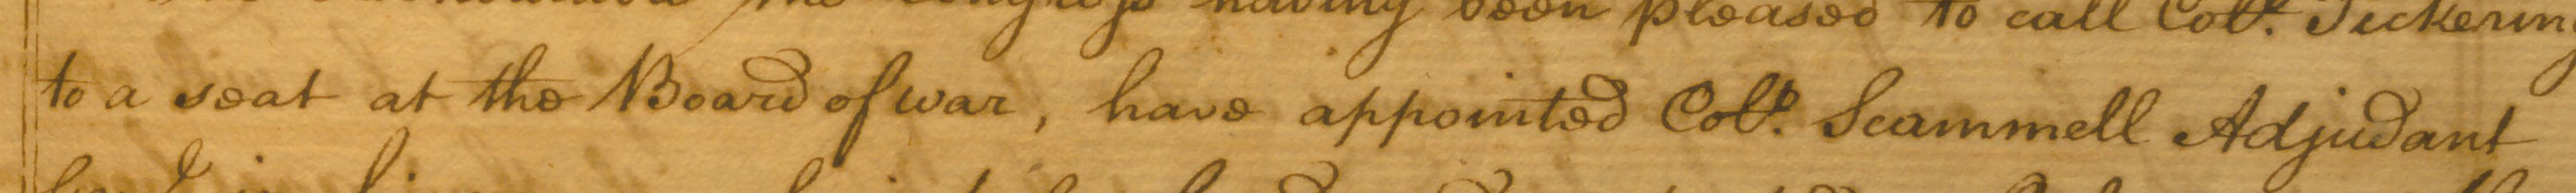to a seat at the Board of war, have appointed Col^o. Scammell Adjudant
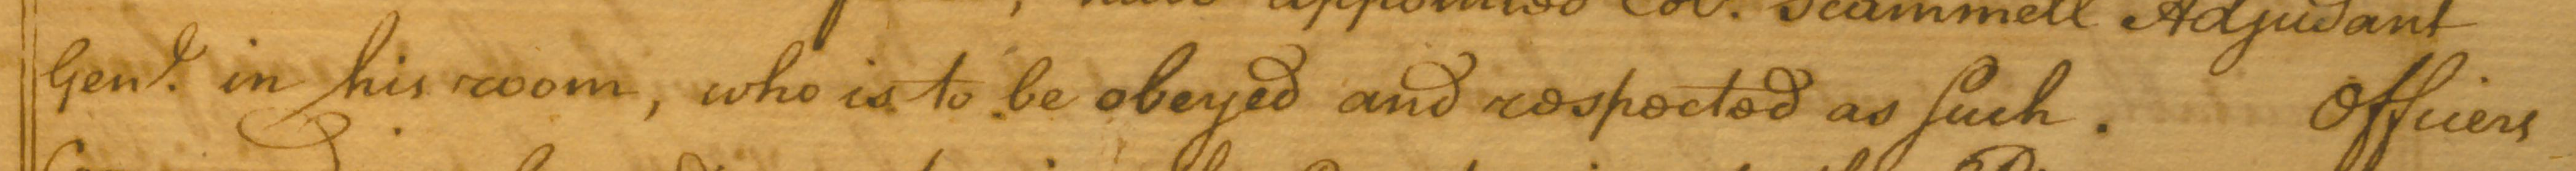Gen^l. in his room, who is to be obeyed and respected as such. Officers
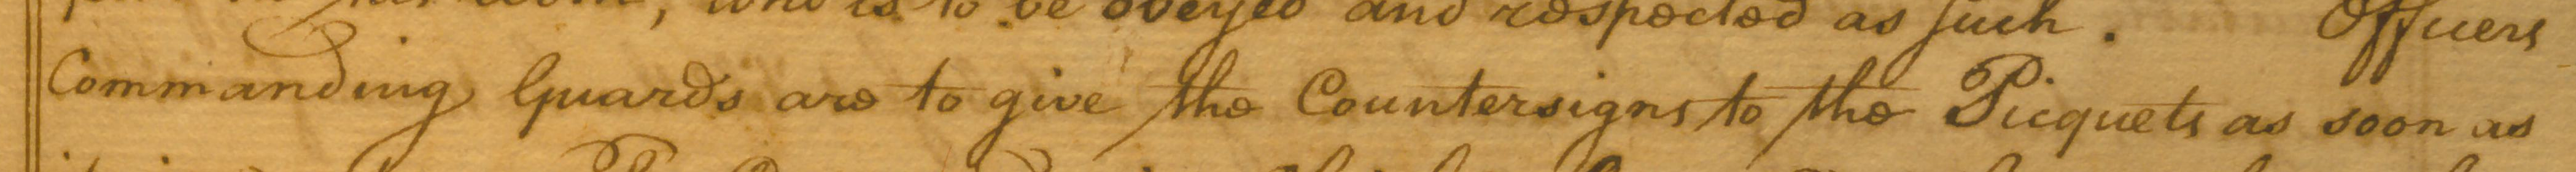commanding Guards are to give the Countersigns to the Picquets as soon as
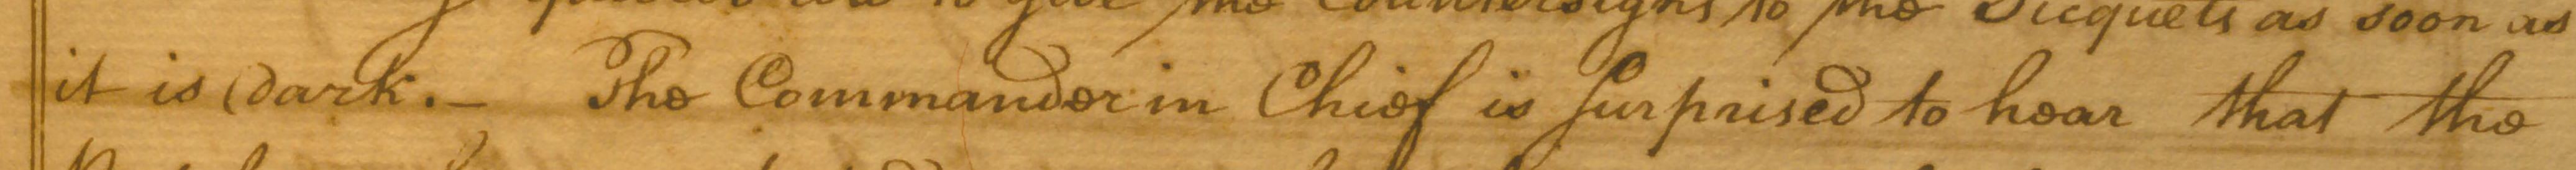it is dark.- The Commander in Chief is surprised to hear that the
